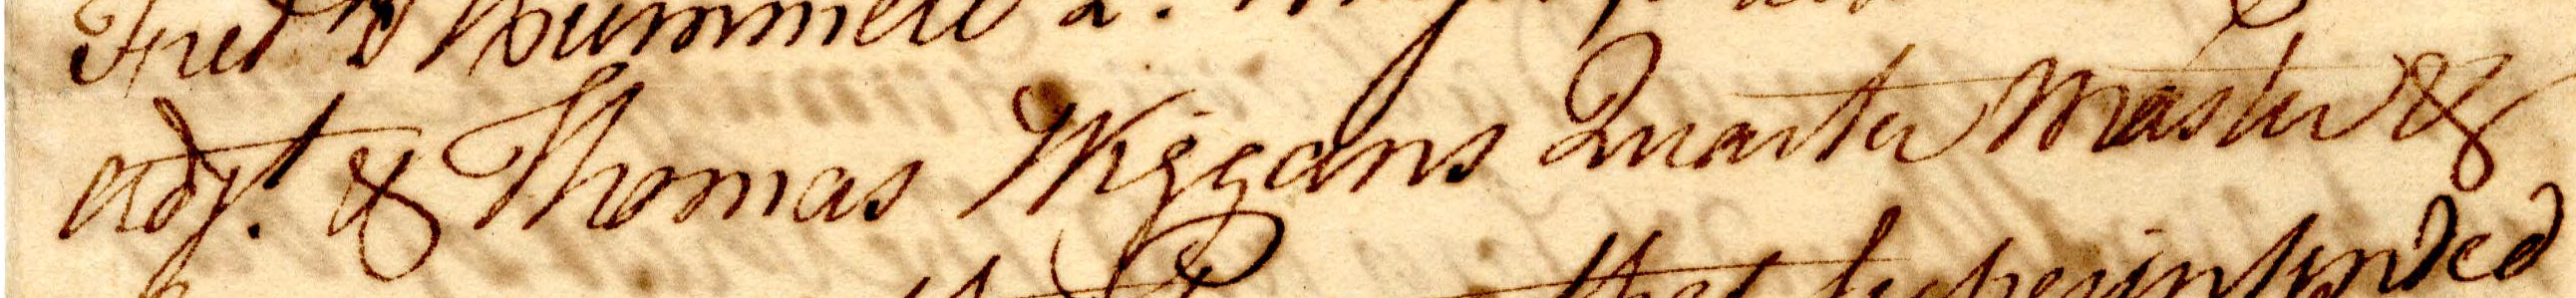Adj^t. & Thomas Wiggans Quarter Master &
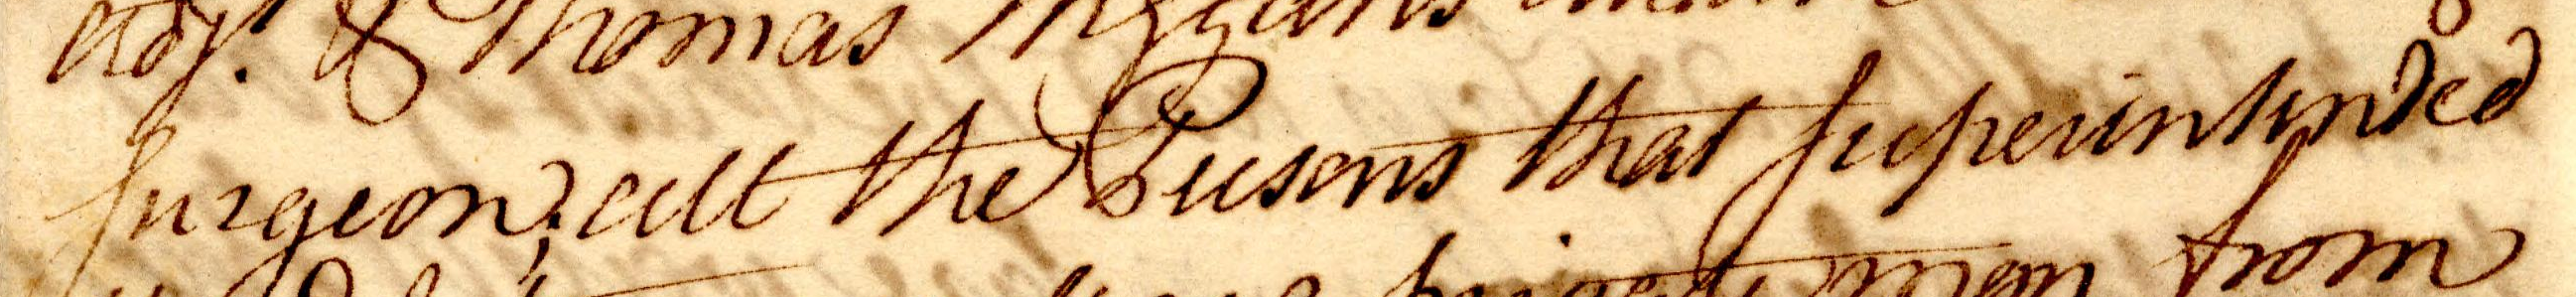Surgeon; all the Persons that superintended
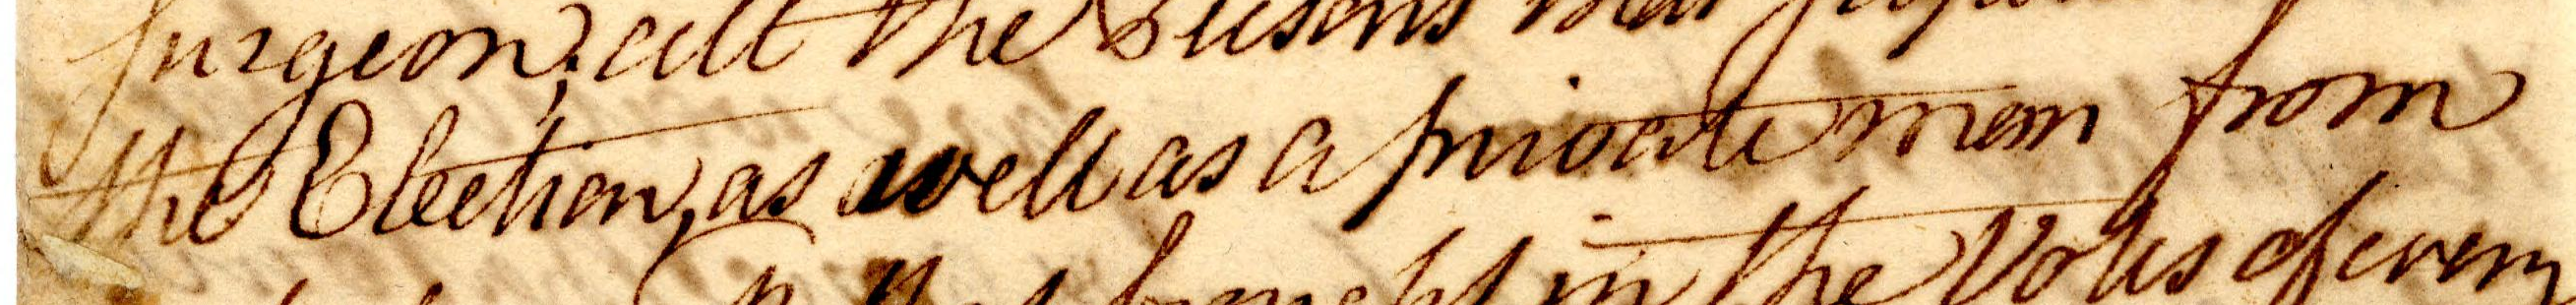the Election, as well as a private man from
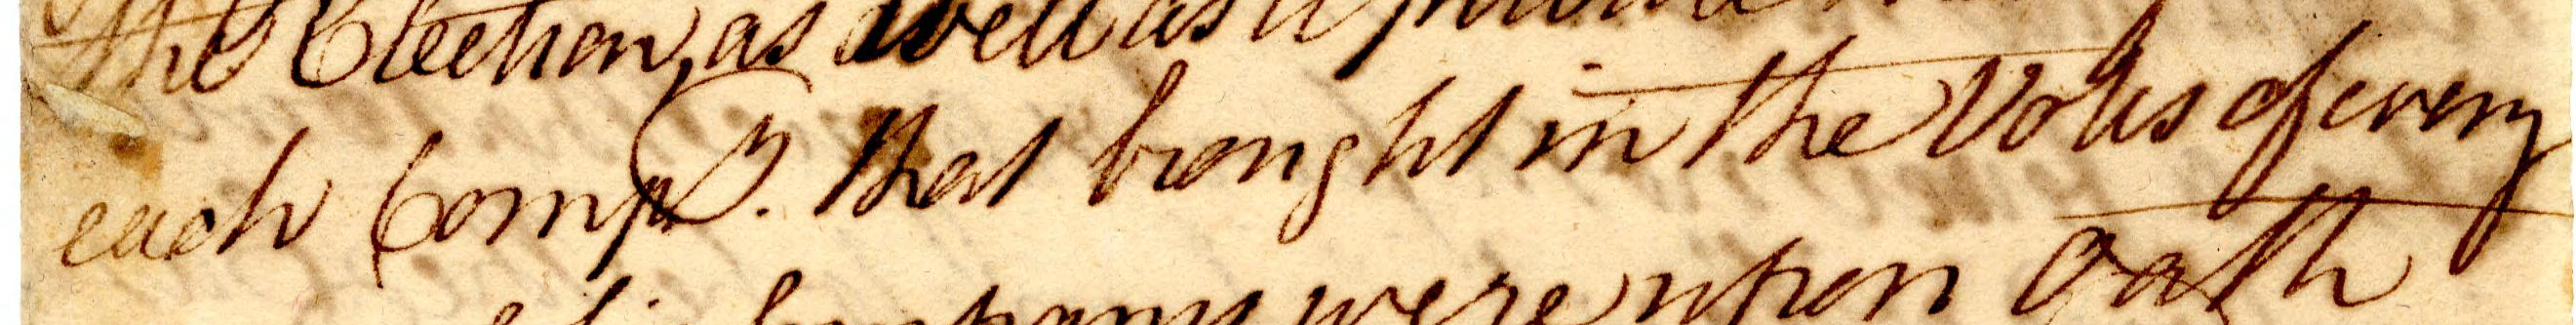each Comp^y. that brought in the Votes of every
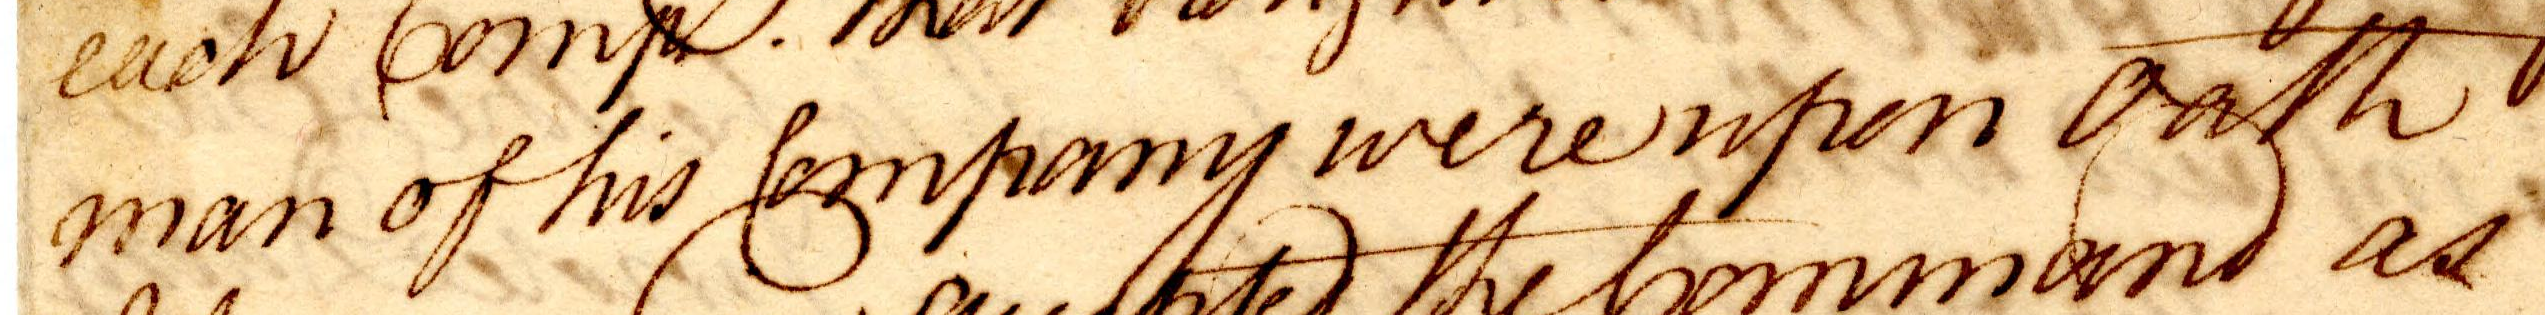man of his Company were upon Oath
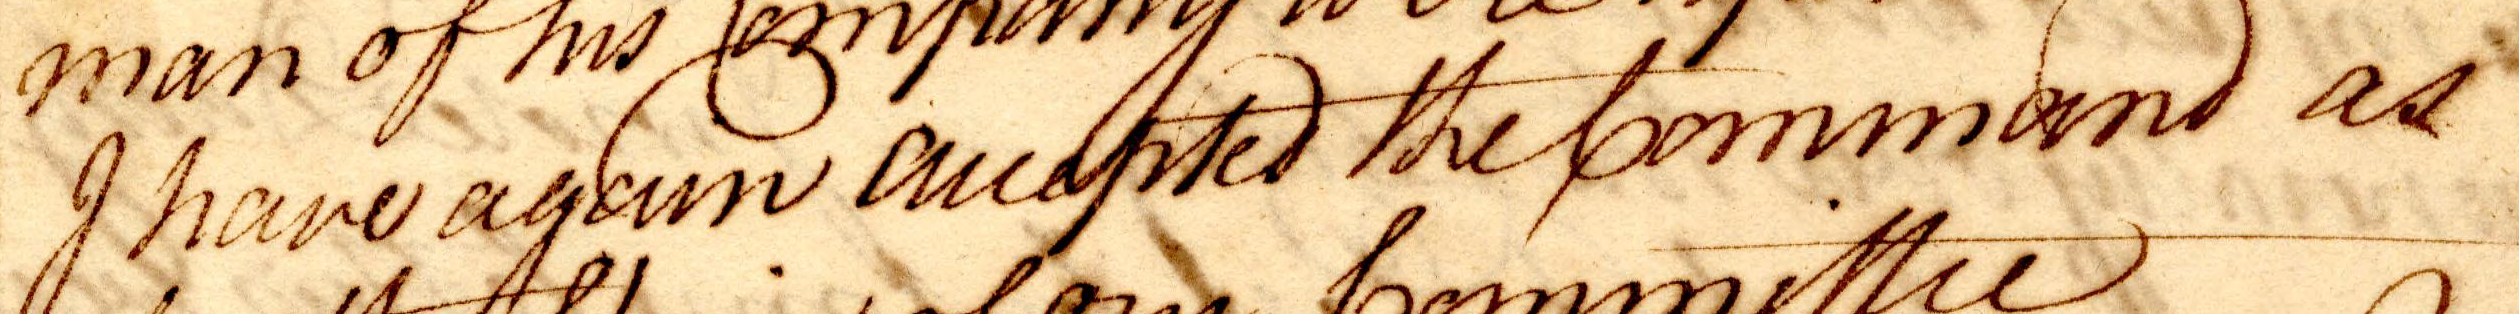I have again accepted the Command as
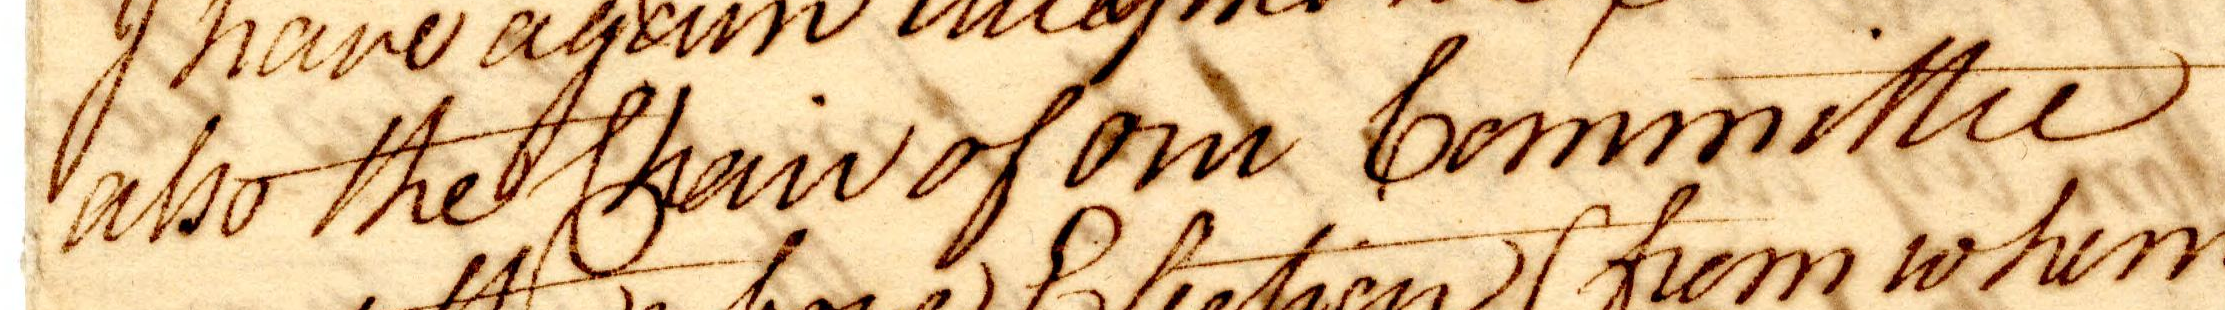also the Chain of our Committee
